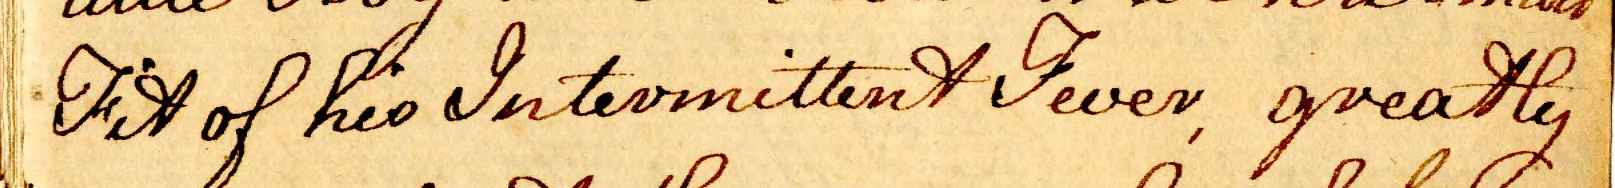Fitt of his Intermittent Fever, greatly
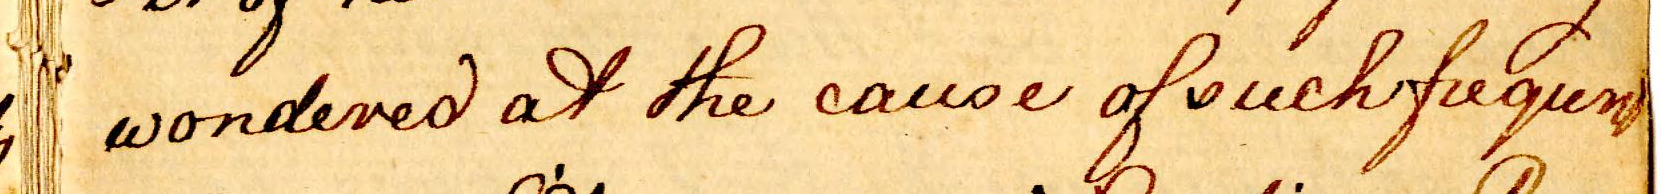wondered at the cause of such frequent
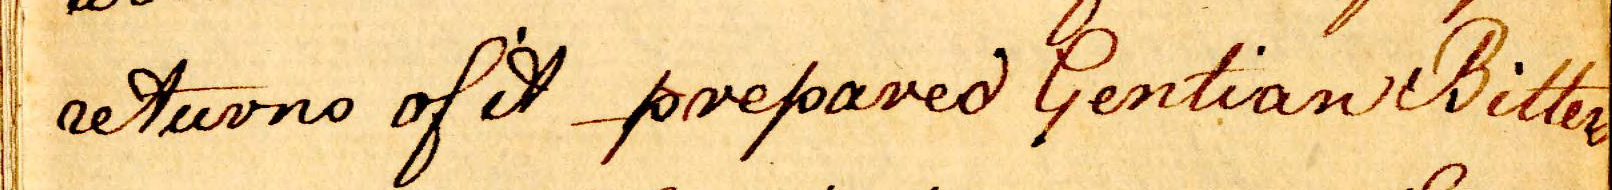returns of it- prepared Gentian Bitters
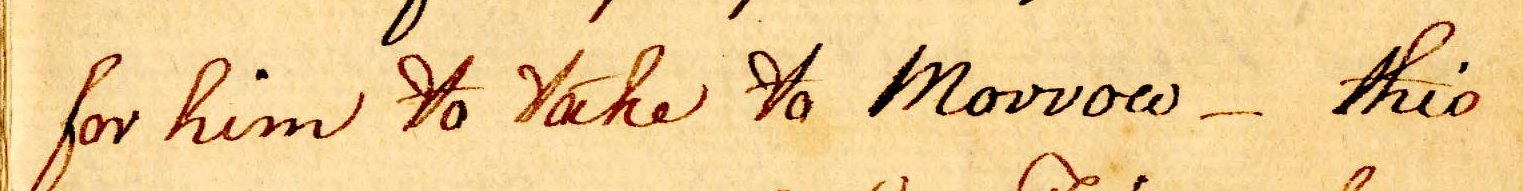for him to take to Morrow- this
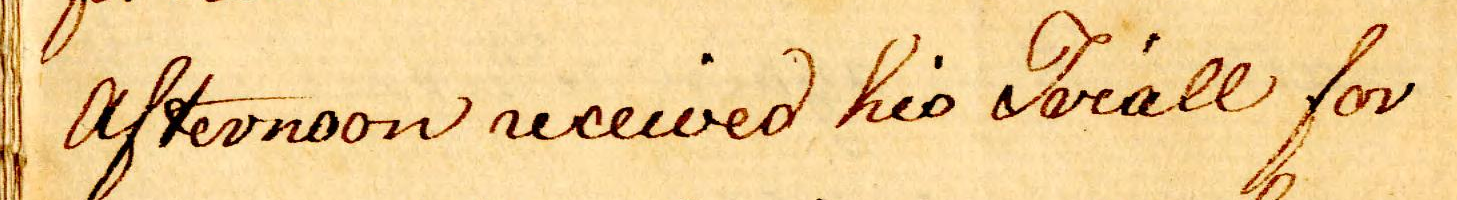Afternoon received his Triall for
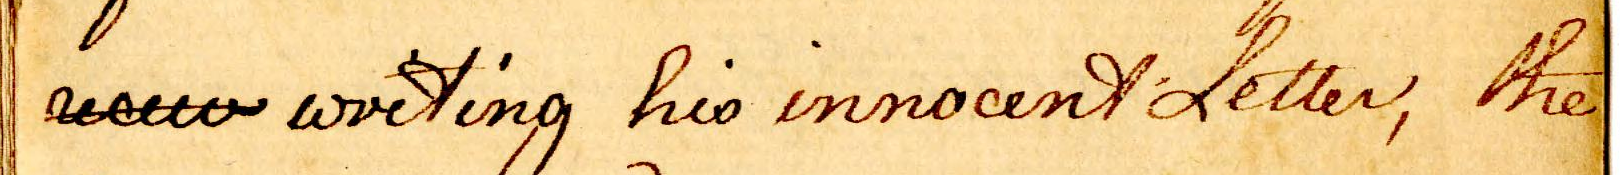[receiv] writing his innocent Letter, the
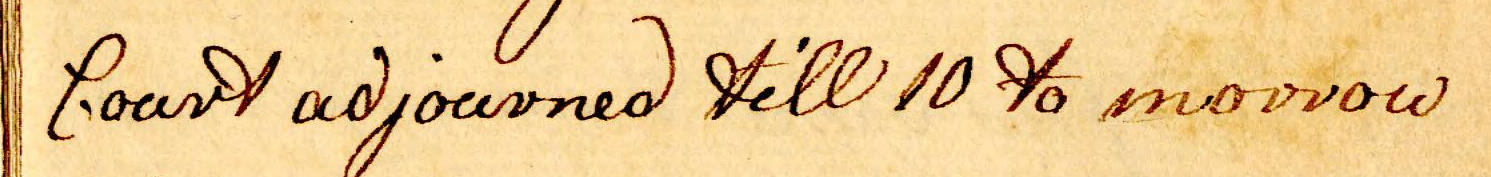Court adjourned till 10 to morrow
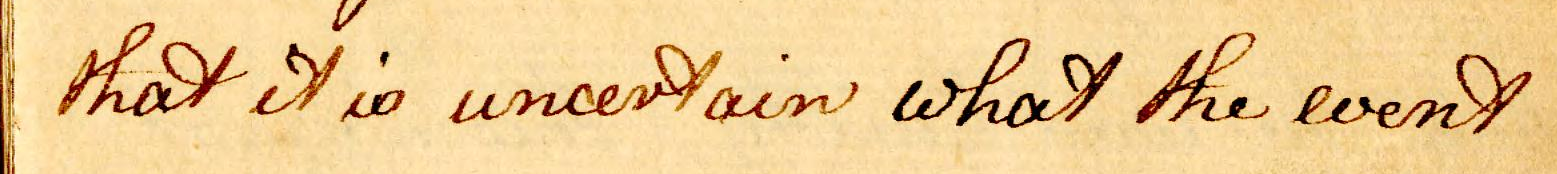that it is uncertain what the event
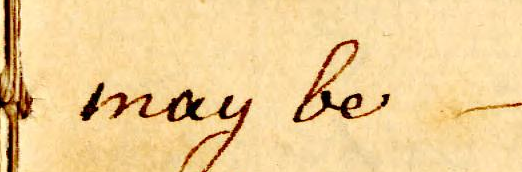may be
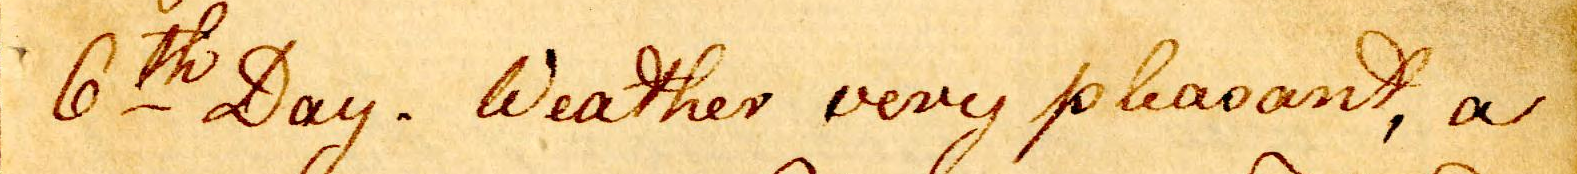6^th Day. Weather very pleasant, a
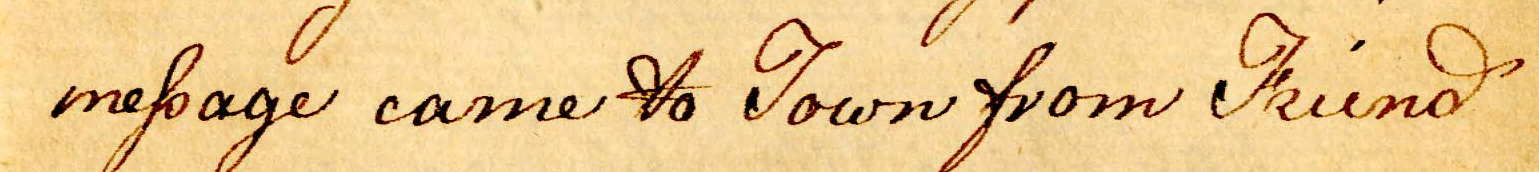message came to Town from Friend
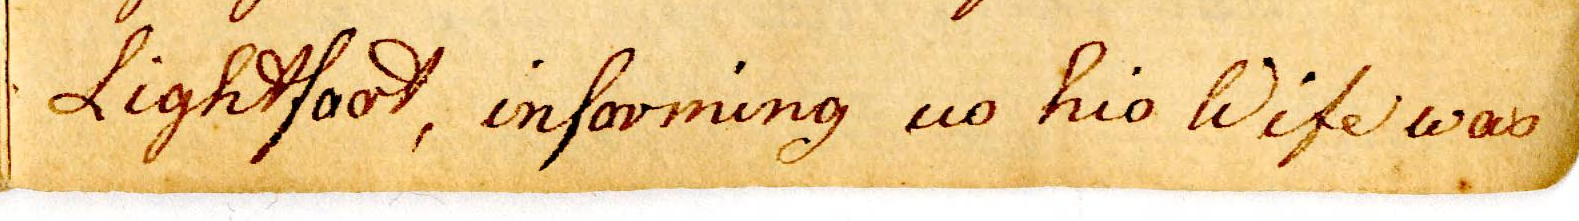Lightfoot, informing us his Wife was
